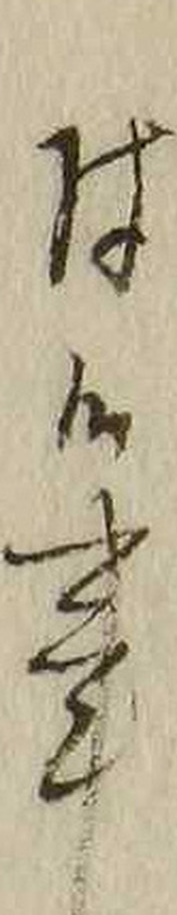付候事
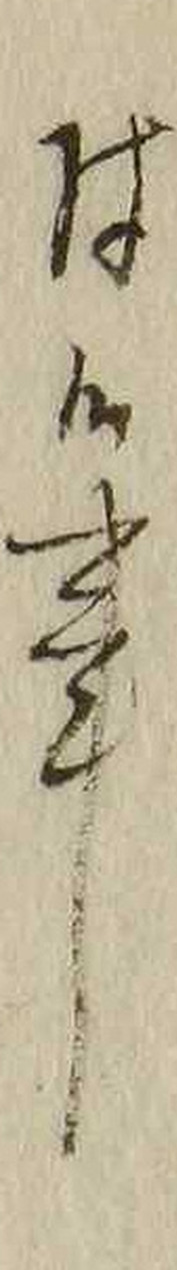付候事
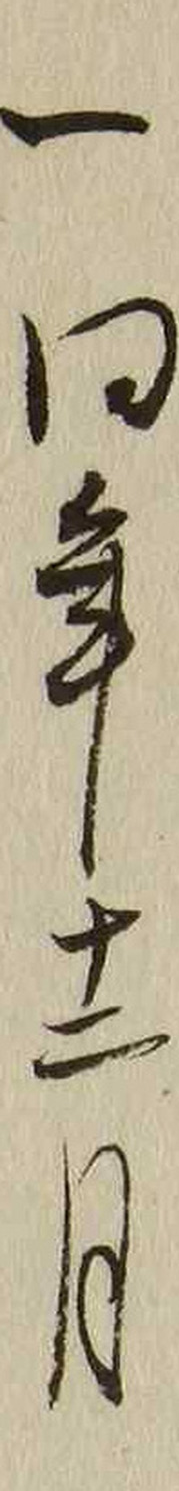一同年十二月
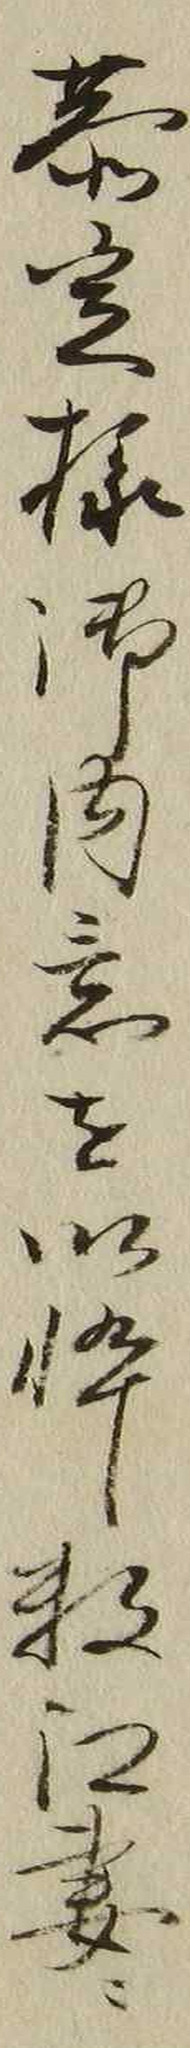恭定様御内意を以忰数江妻ニ
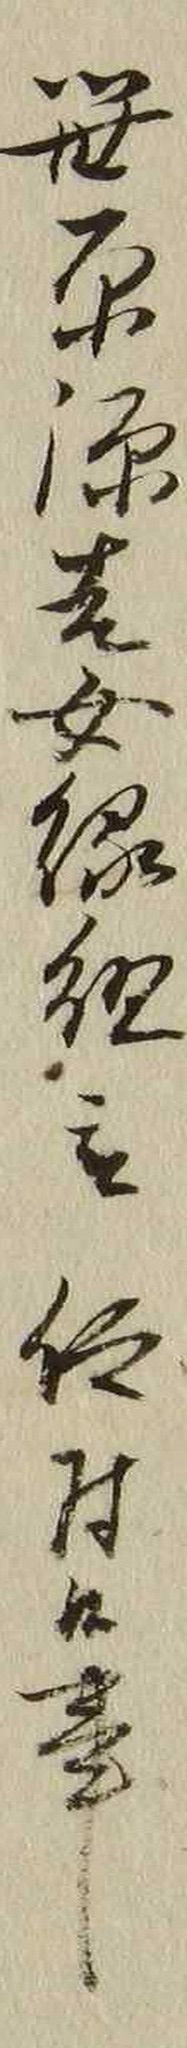笹原源吉女縁組被仰付候事
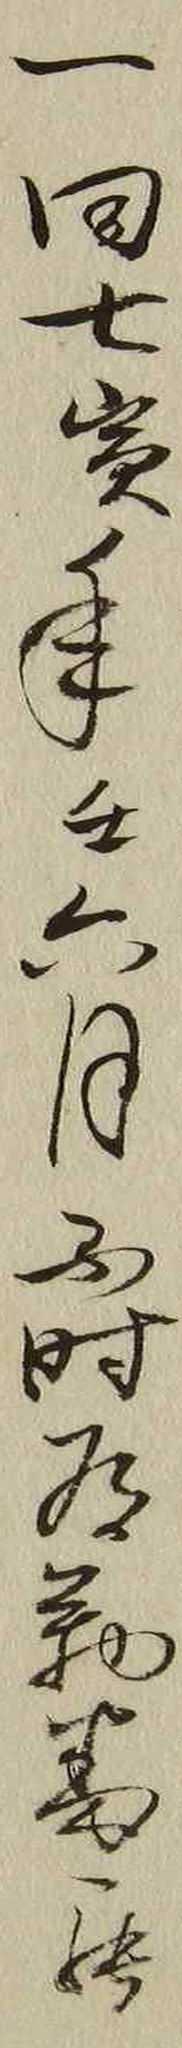一同七寅年閏六月不時為勤番罷
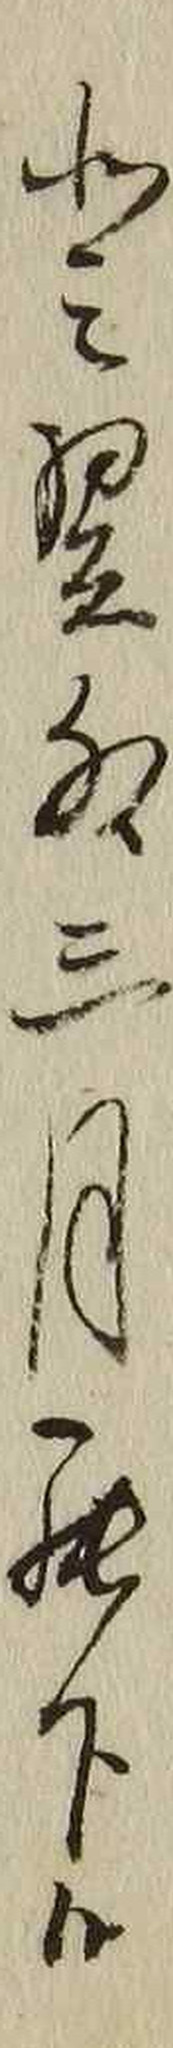登翌卯三月罷下候
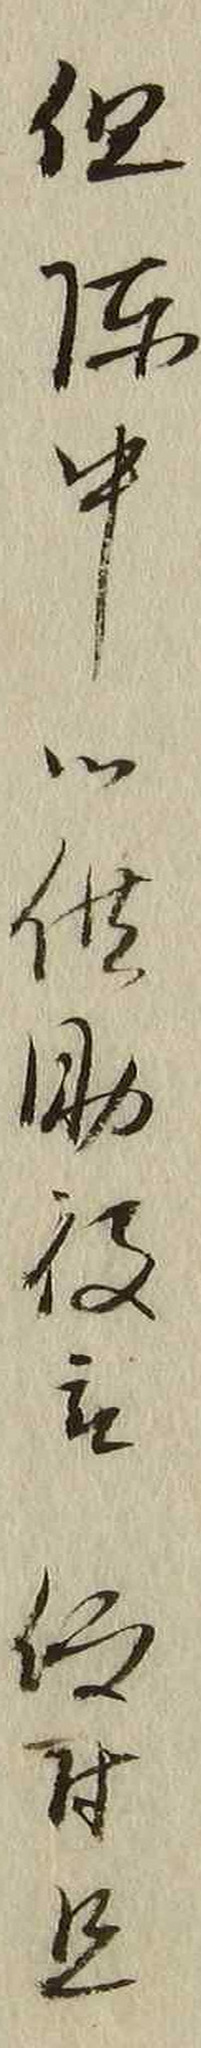但陣中御供助役被仰付且
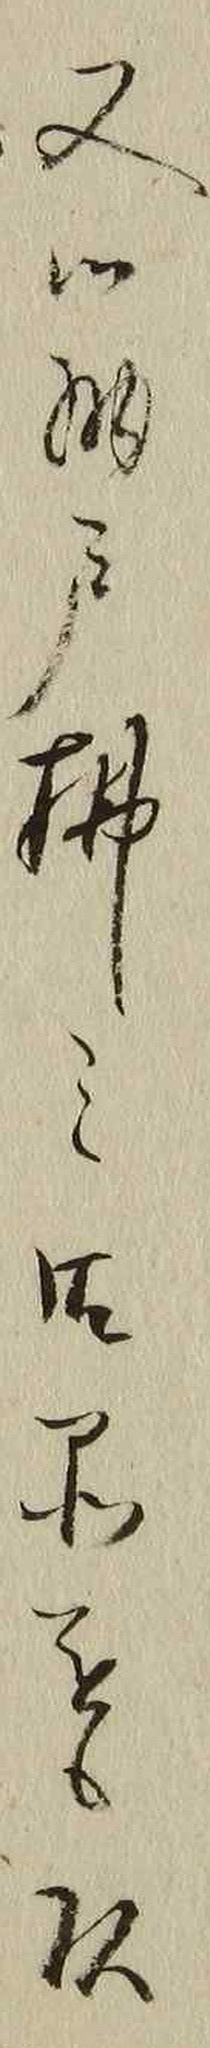又御納戸払之御品をも頂
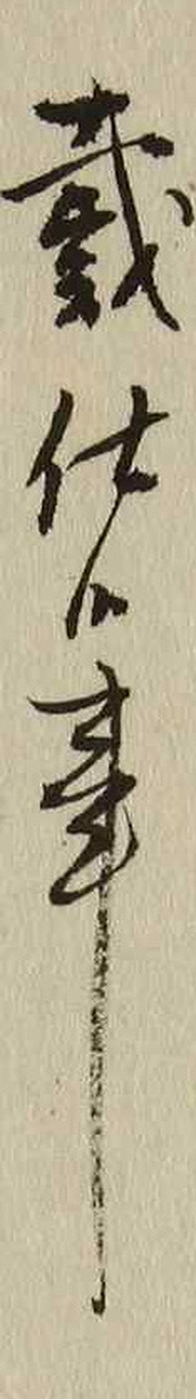戴仕候事
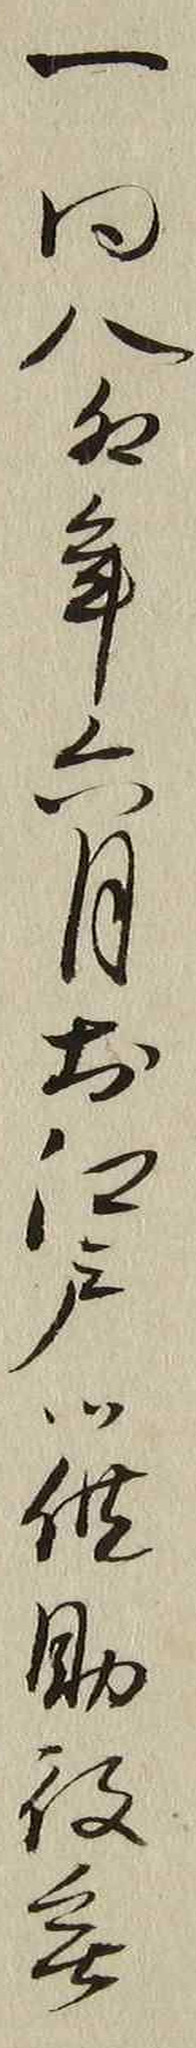一同八卯年六月於江戸御供助役無
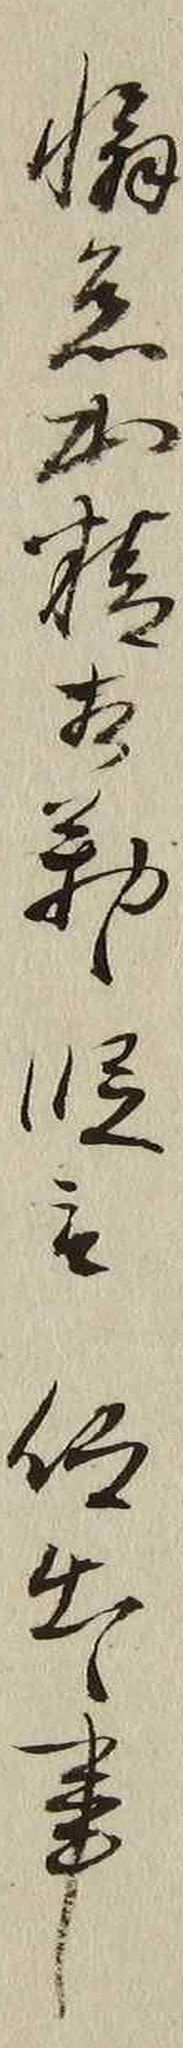懈怠出精相勤候段被仰出候事
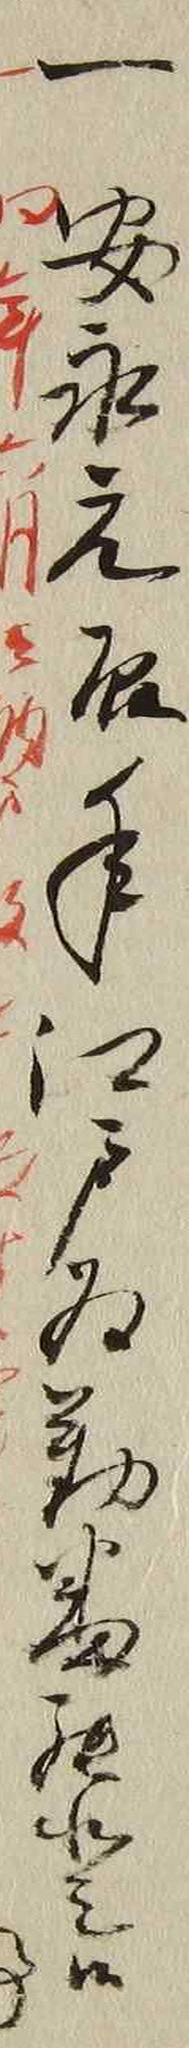一安永元辰年江戸為勤番罷登候事
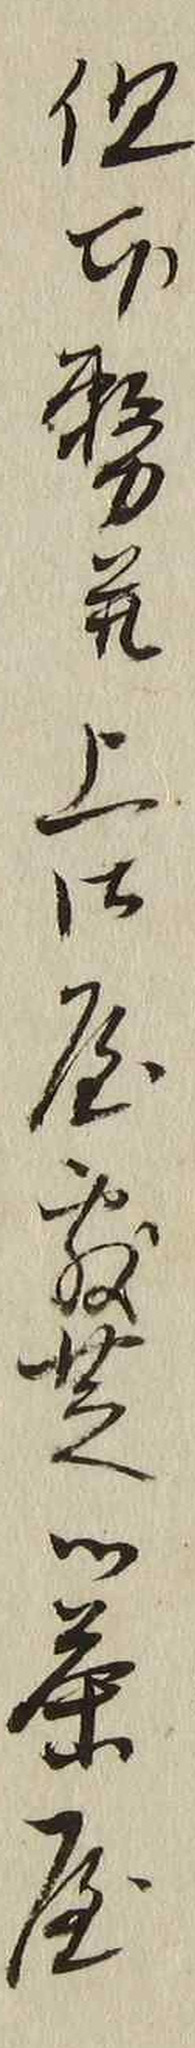但本務并上御屋敷芝御茶屋
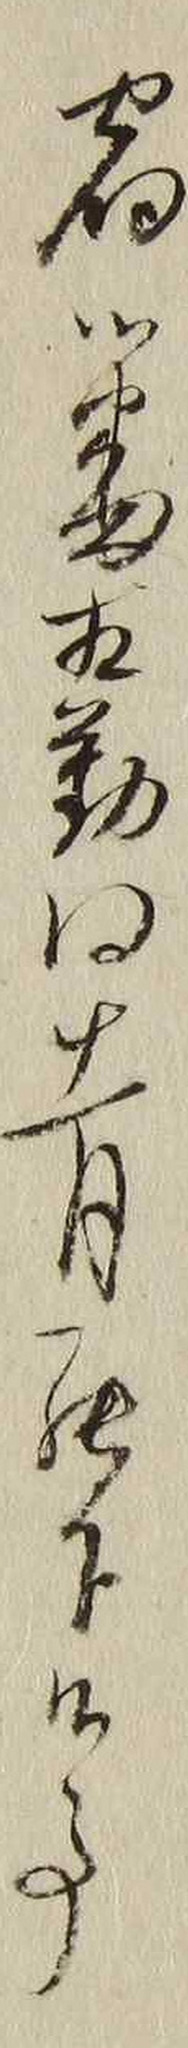宿御番相勤同十一月罷下候事
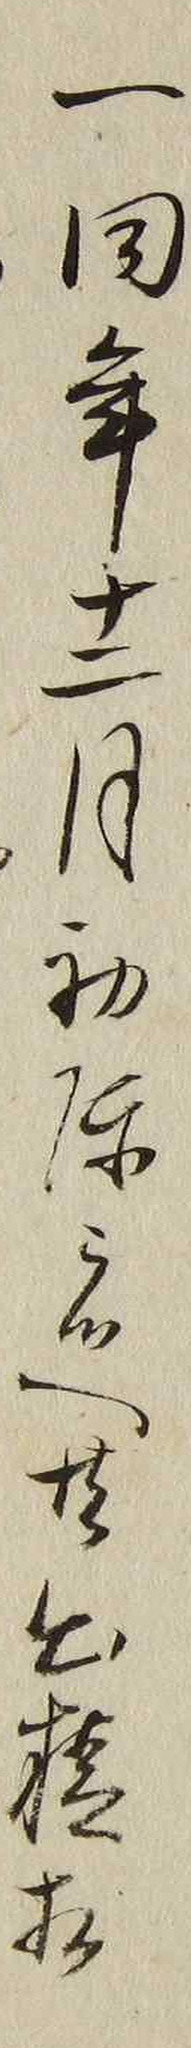一同年十二月初陣ニ候へ共出精相
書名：諸士系譜　巻之359　す之部9
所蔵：会津若松市立会津図書館
